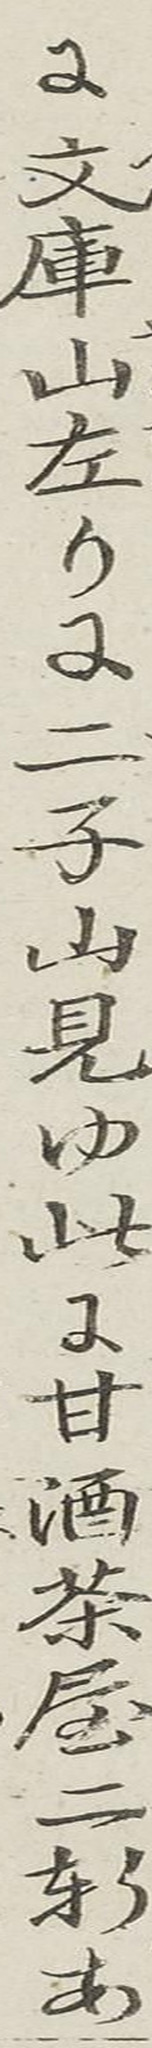に文庫山左りに二子山見ゆ此に甘酒茶屋二軒あ
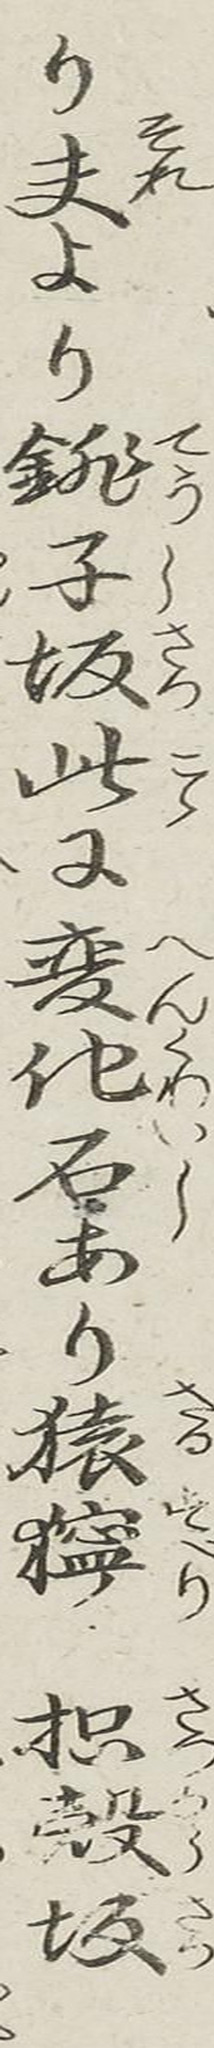り夫より銚子坂此に変化石あり猿獰枳殻坂
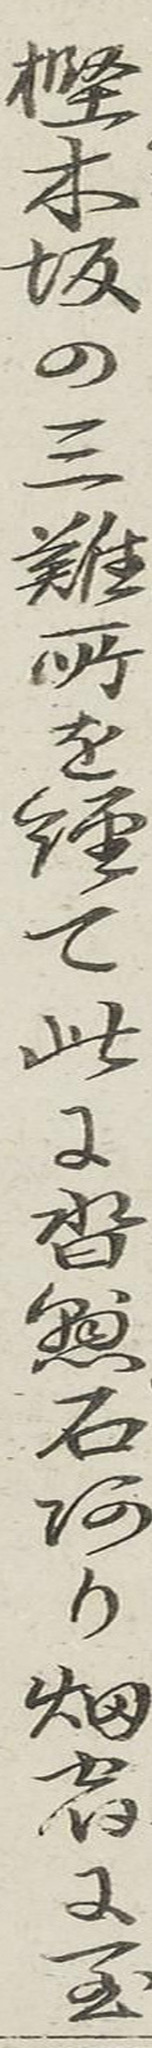樫木坂の三難所を経て此に沓懸石あり畑宿に至
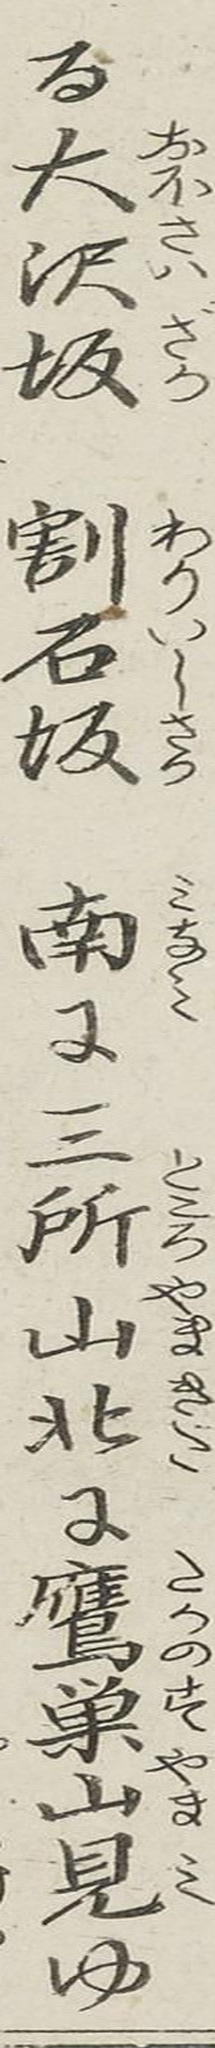る大沢坂割石坂南に三所山北に鷹巣山見ゆ
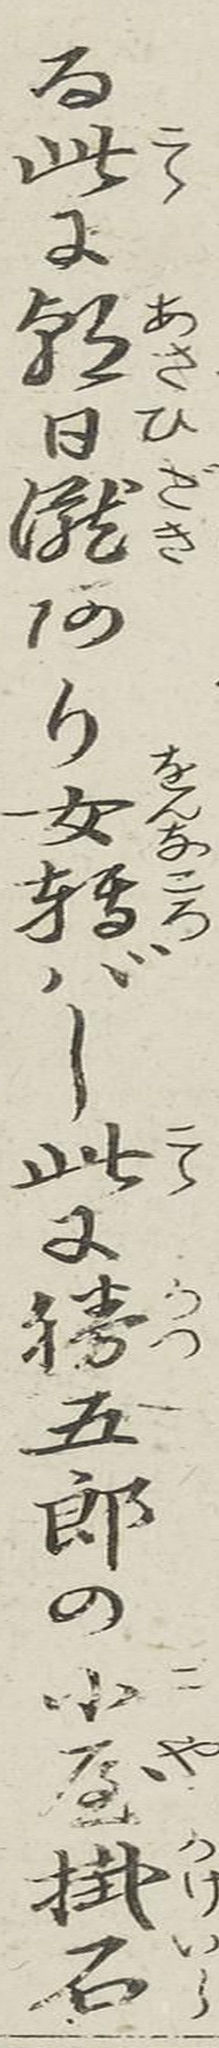る此に朝日瀧あり女転ばし此に勝五郎の小屋掛石

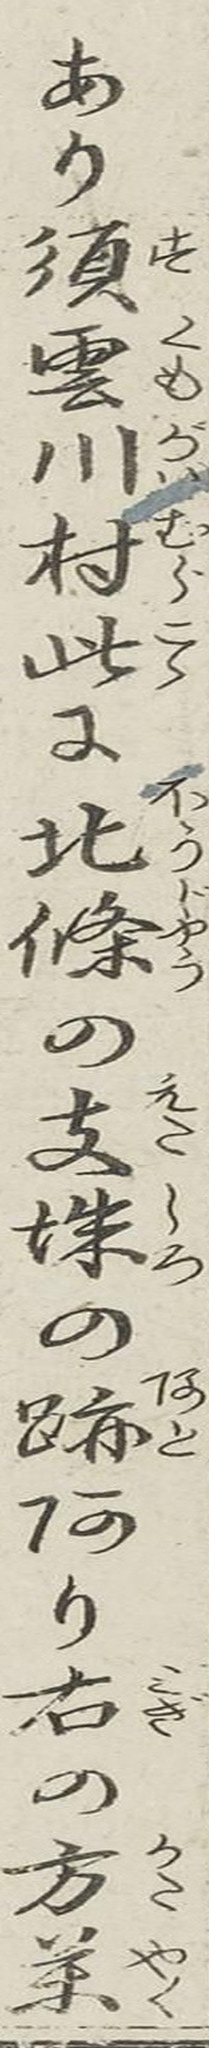あり須雲川村此に北条の支城の跡あり右の方薬
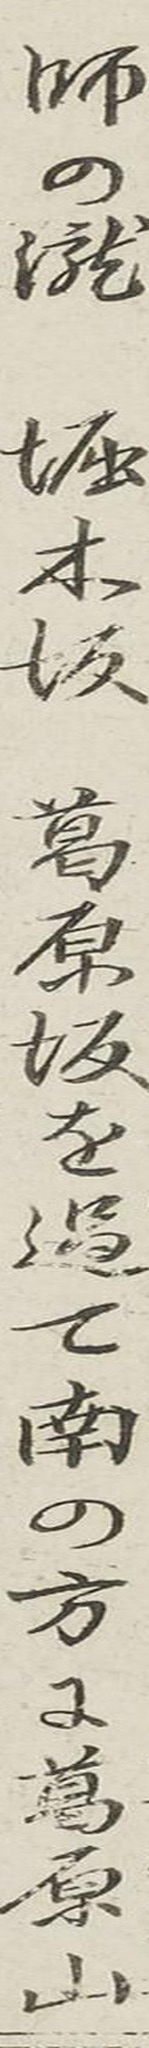師の滝堀木坂葛原坂を過て南の方に葛原山
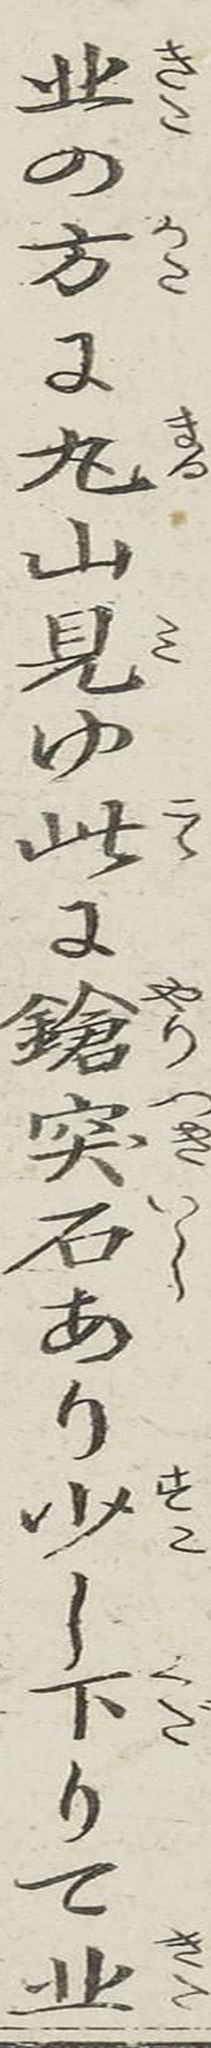北の方に丸山見ゆ此に鎗突石あり少し下りて北
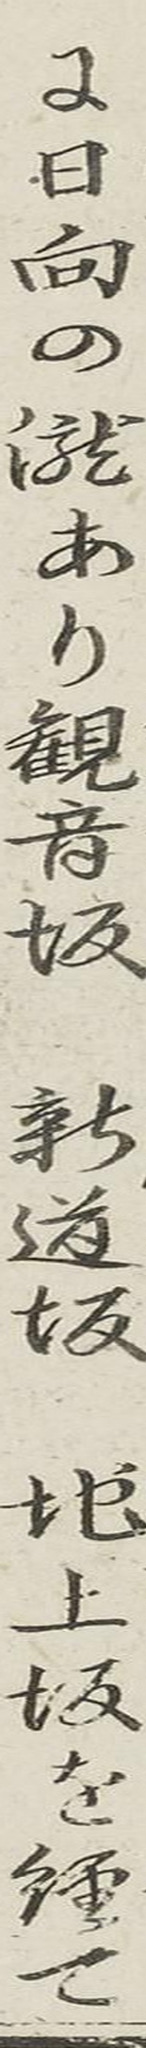に日向の滝あり観音坂新道坂地上坂を経て
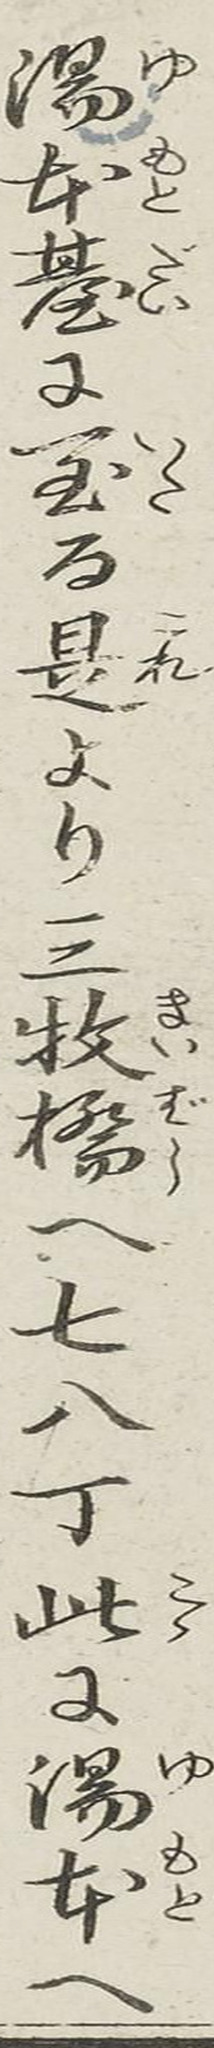湯本台に至る是より三枚橋へ七八丁此に湯本へ
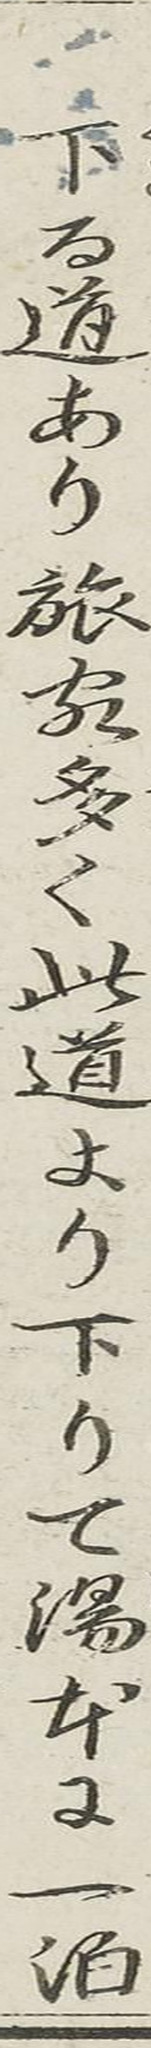下る道あり旅客多く此道より下りて湯本に一泊
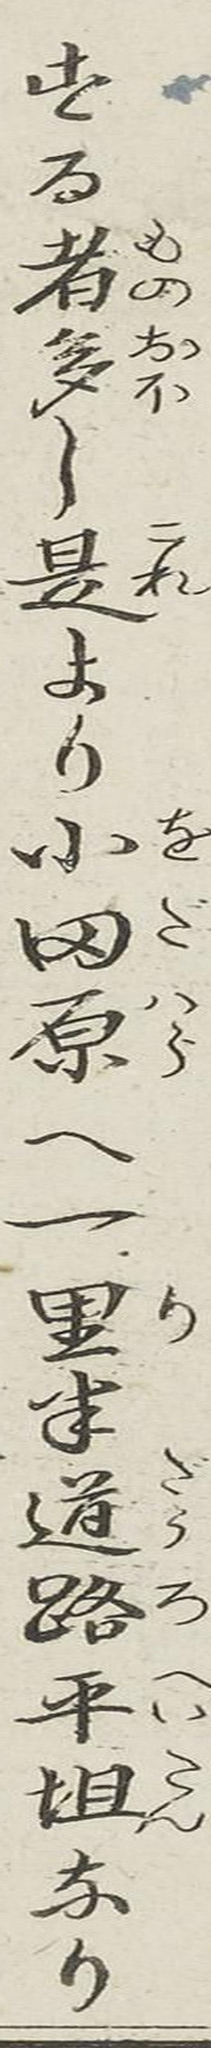する者多し是より小田原へ一里半道路平坦なり
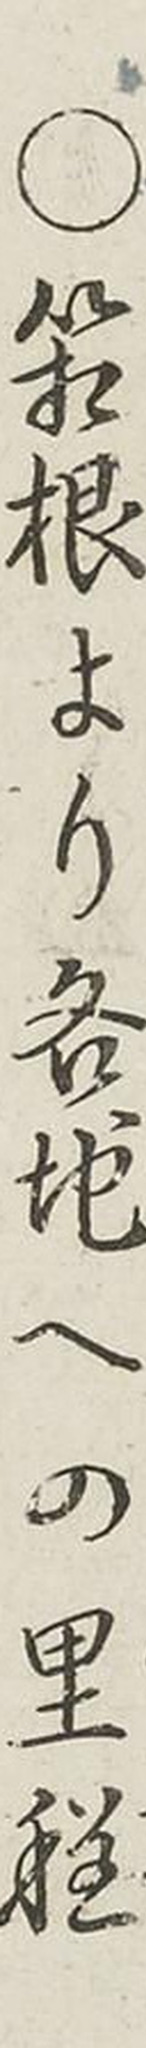○箱根より各地への里程
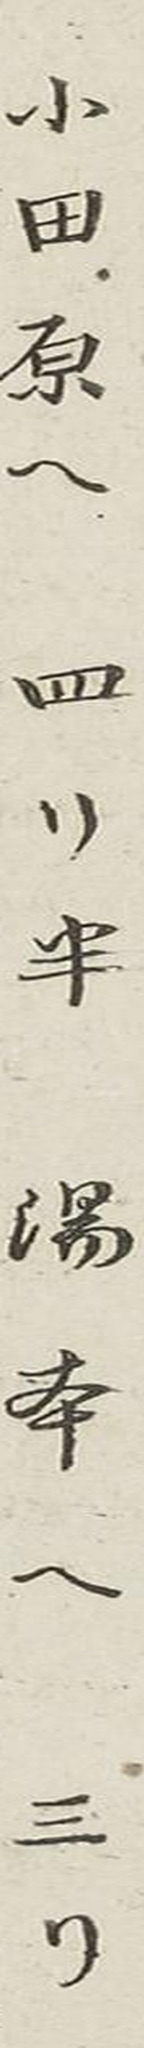小田原へ四り半湯本へ三り
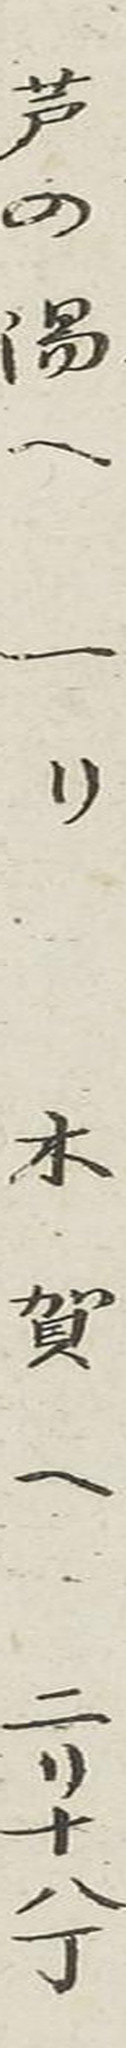芦の湯へ一り木賀げ二り十八丁
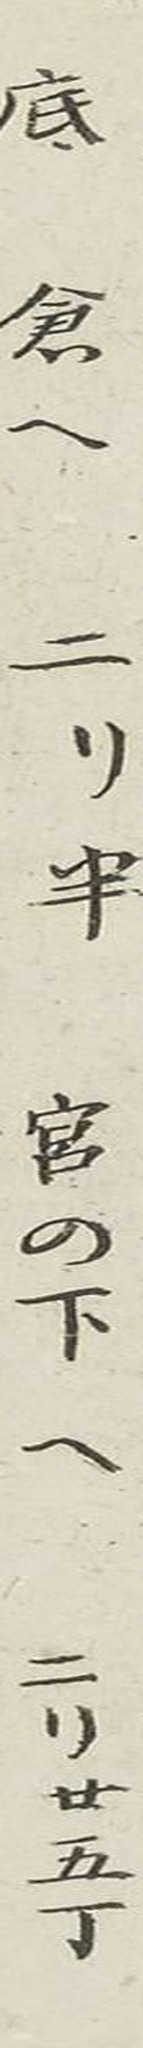底倉へ二り半宮の下へ二り廿五丁
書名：箱根温泉誌　全
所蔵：東京大学地震研究所図書室 Earthquake Research Institute Library, The University of Tokyo, JAPAN
